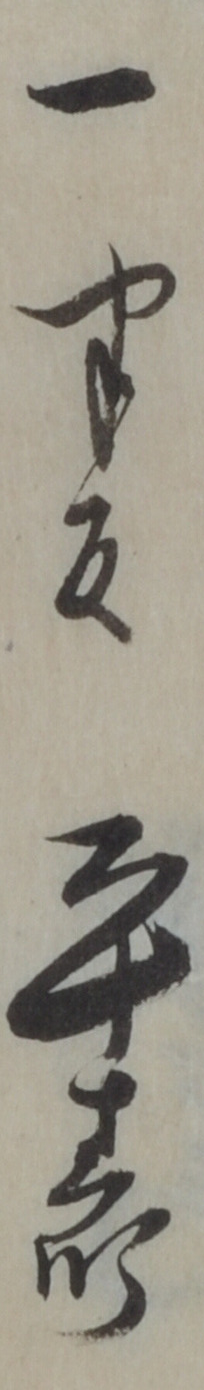一半反染吉
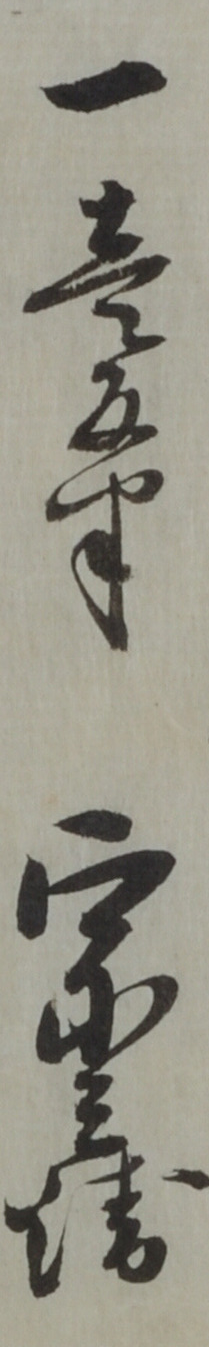一壱反半宗兵衛
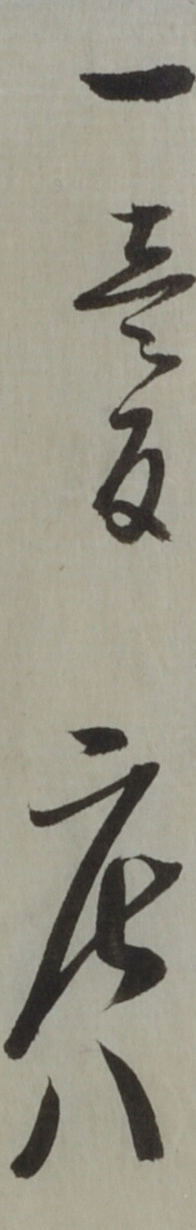一壱反庄八
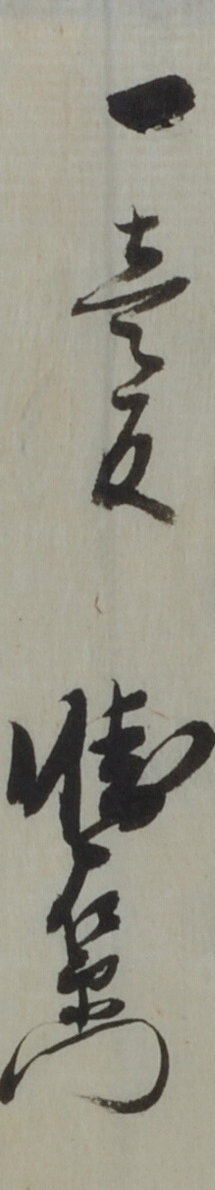一壱反勝右衛門
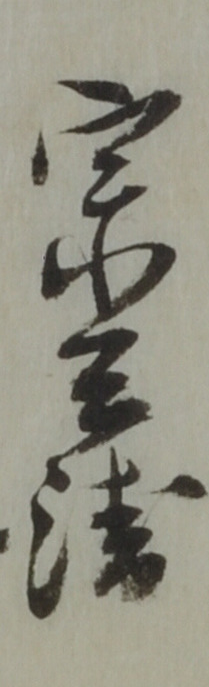宗兵衛
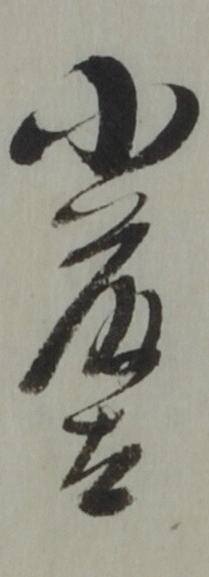小藤太
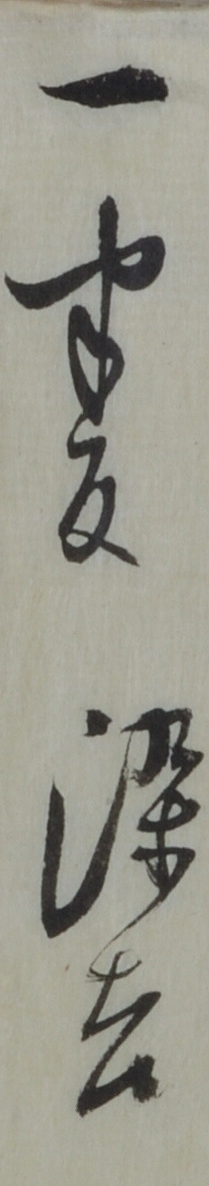一半反染吉

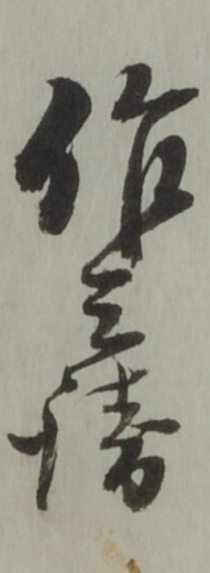作兵衛
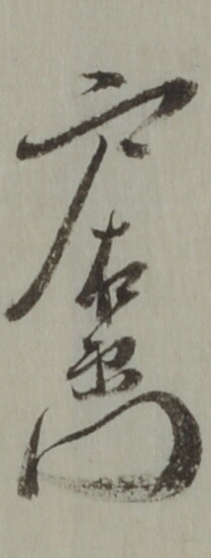戸右衛門
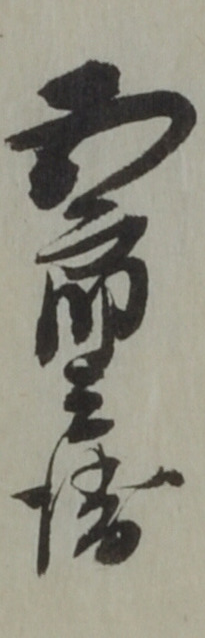五郎兵衛
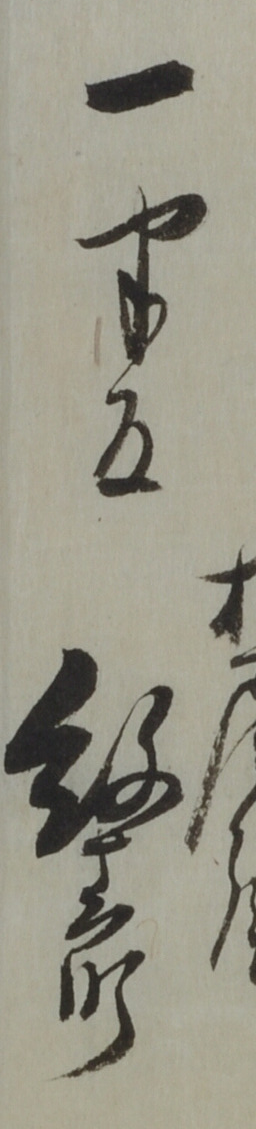一半反紋十郎
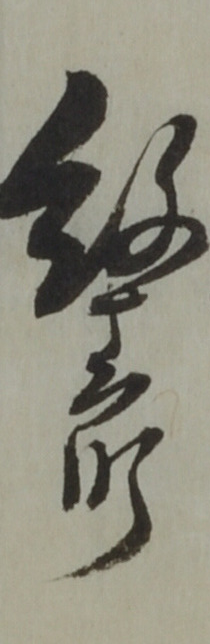作兵衛
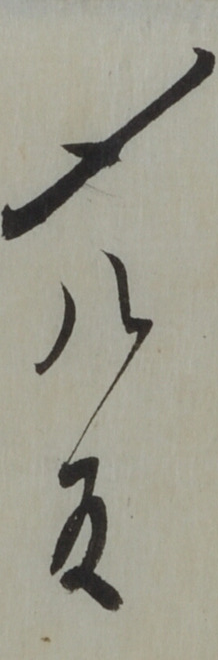〆八反

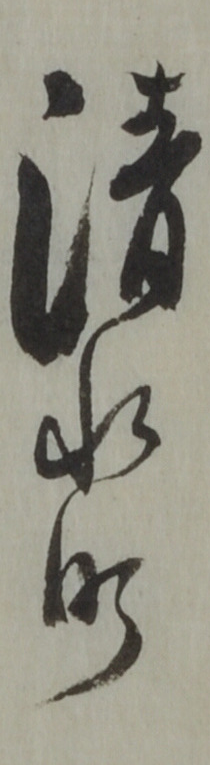清水町
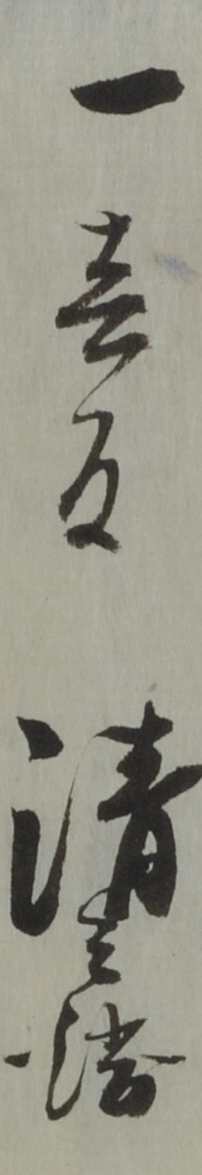一壱反清兵衛
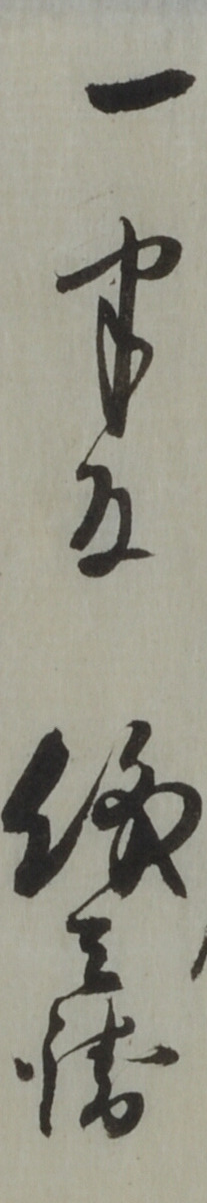一半反儀兵衛
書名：融通割合帳
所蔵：伊那市立高遠町図書館・合同会社AMANE
